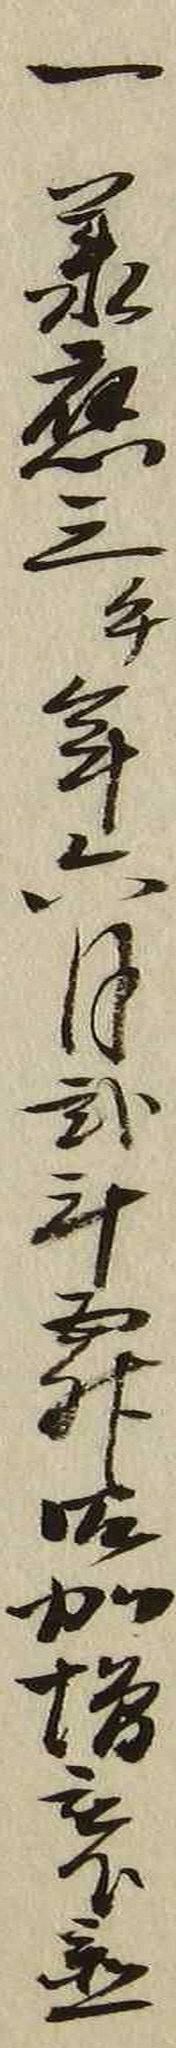一承応三午年六月弐斗五升御加増被下置
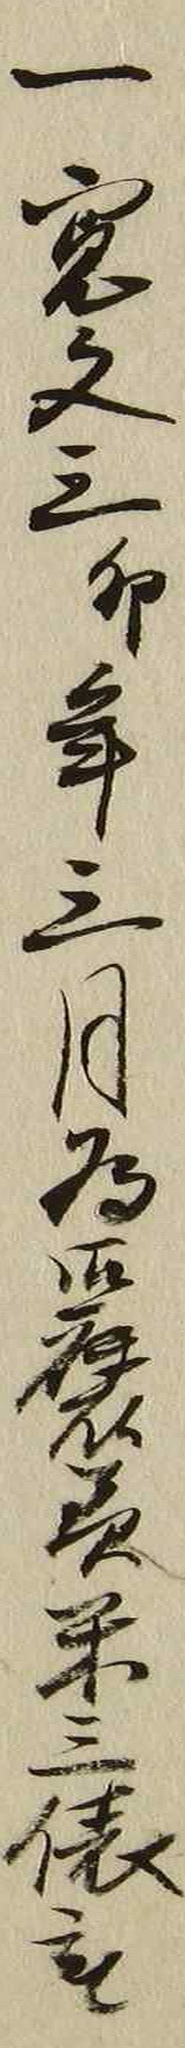一寛文三卯年三月為御褒美米三俵被
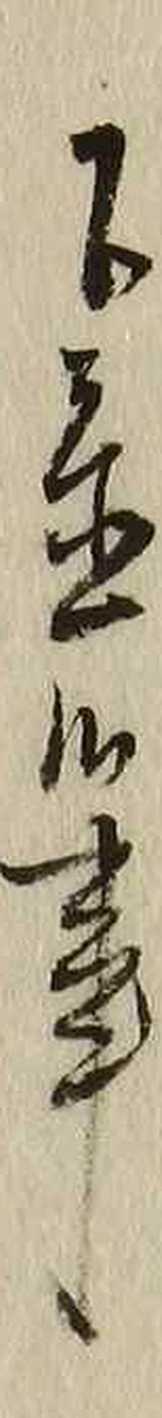下置候事
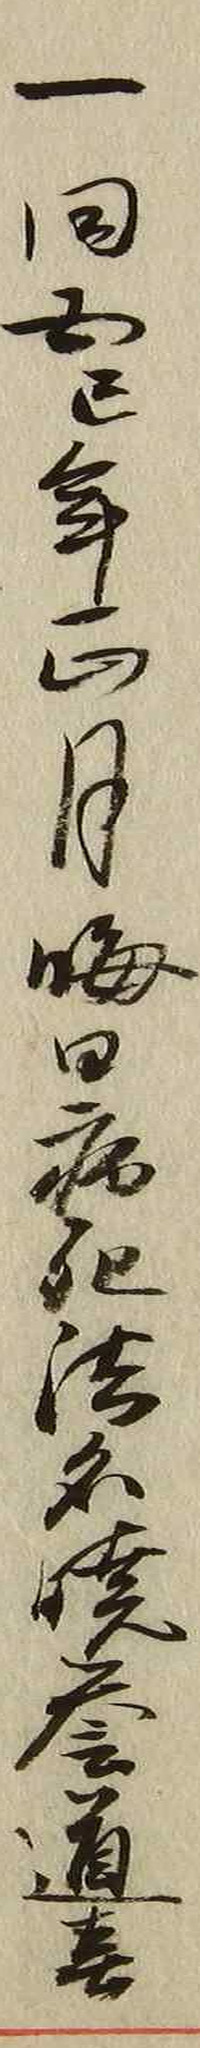一同五巳年六月晦日病死法名暁誉道春
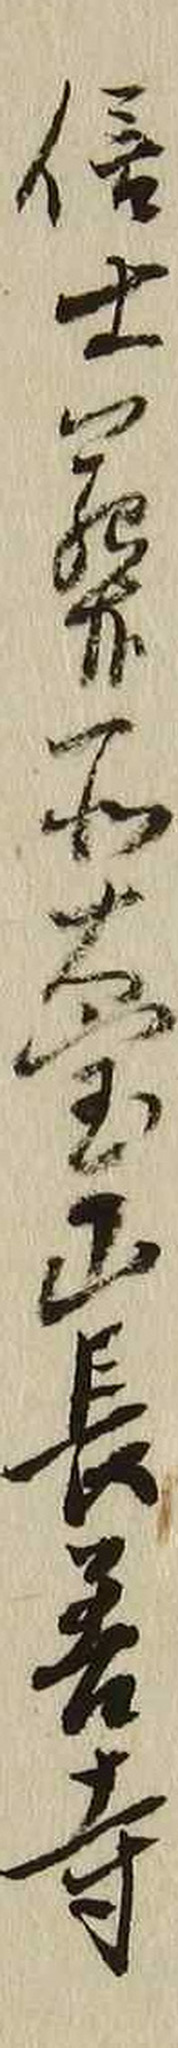信士葬所大宝山正長善寺
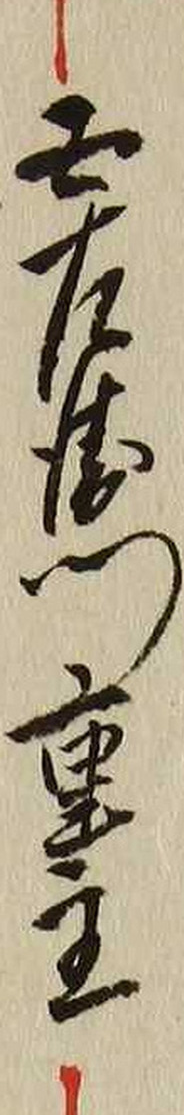五左衛門重主
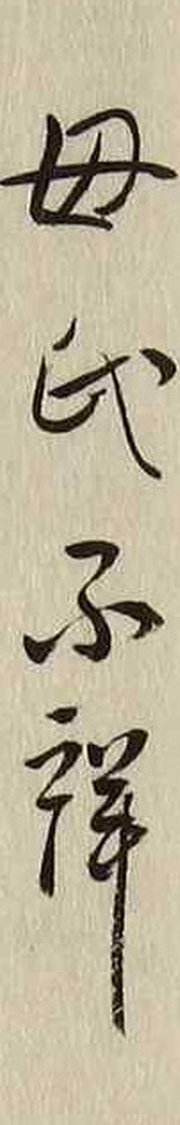母氏不詳
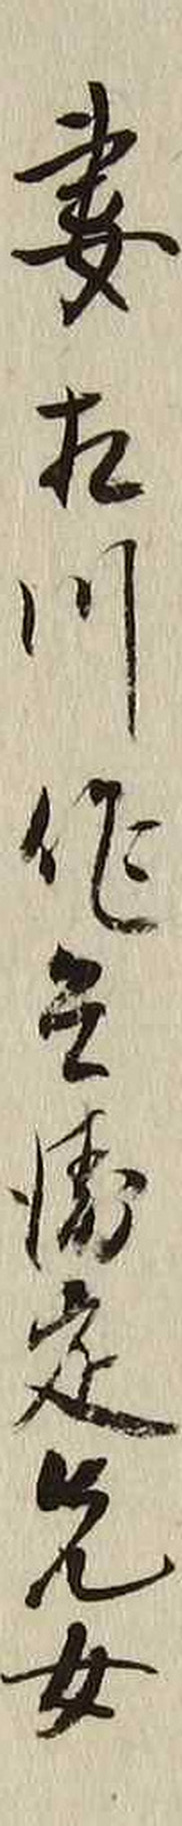妻相川作兵衛定先女
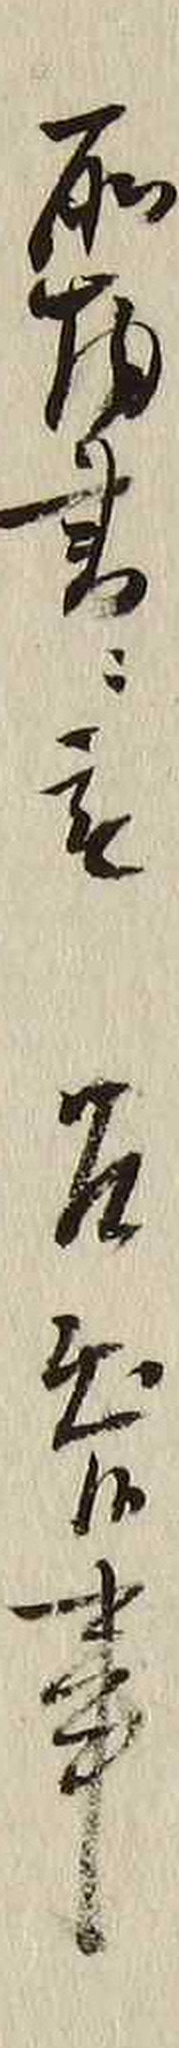所物書被召出候事
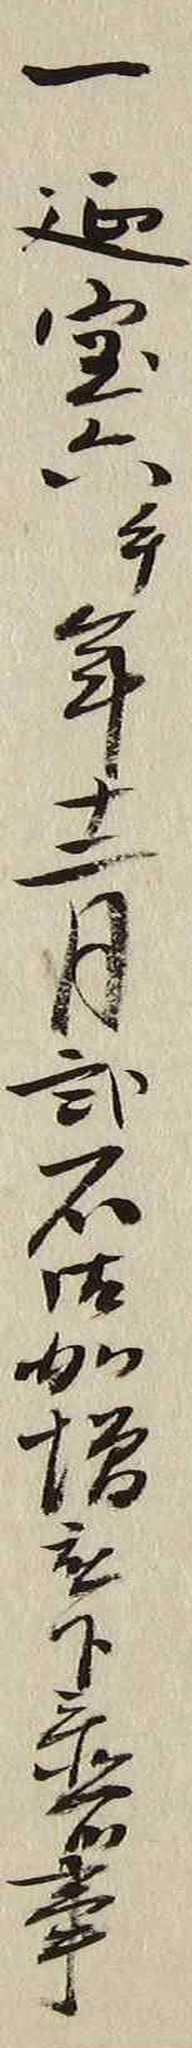一延宝六午年十二月弐石御加増被下置候事
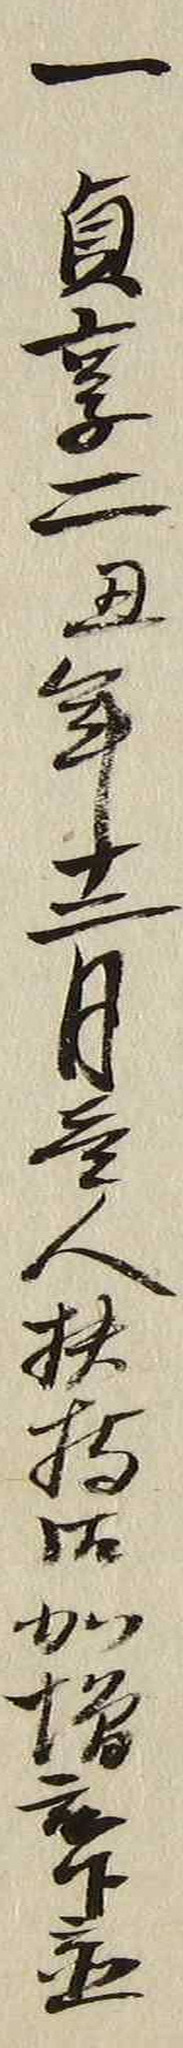一貞享二丑年十二月壱人扶持御加増被下置

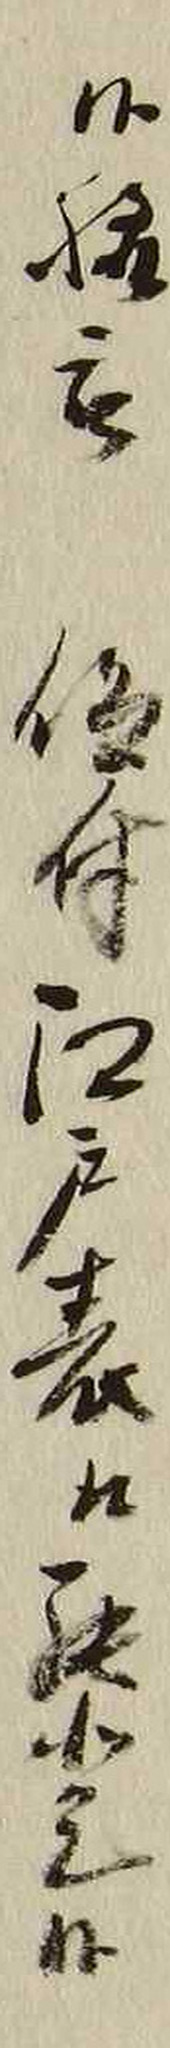候様被仰付江戸表江罷登候
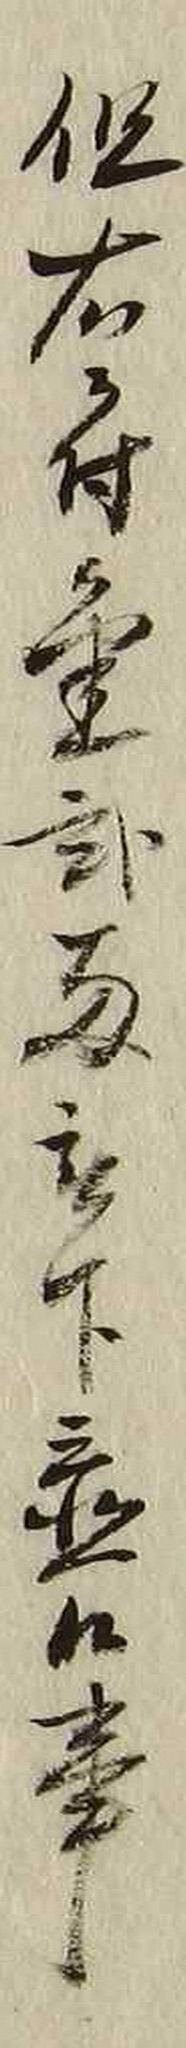但右付金弐両被下置候事
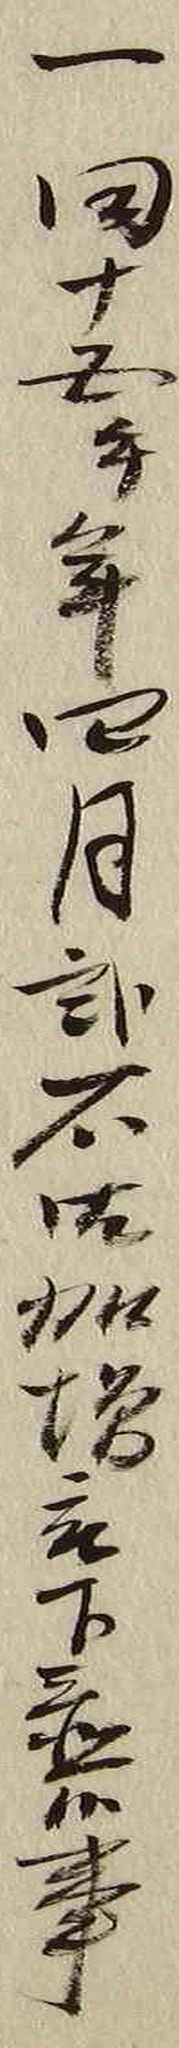一同十五午年四月弐石御加増被下置候事
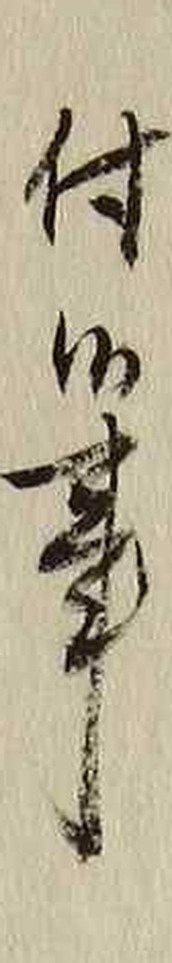付候事
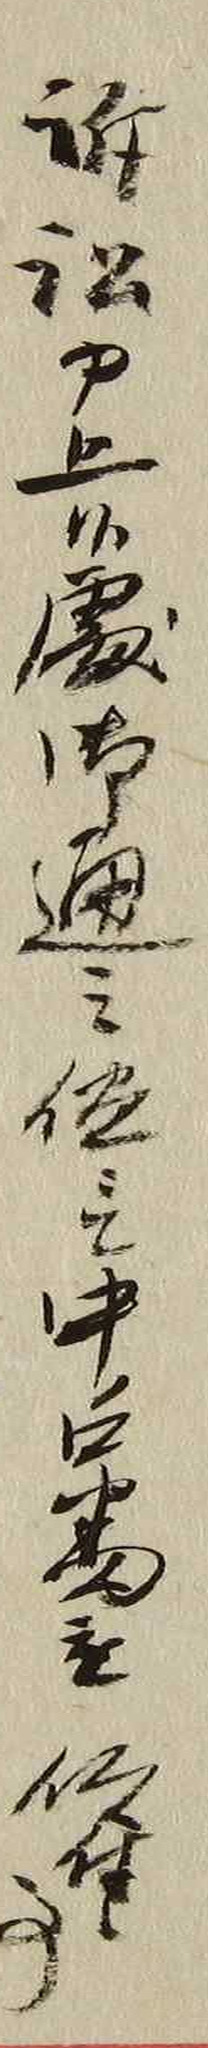訴訟申上候処御通之儘中口番被仰付候事
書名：諸士系譜　巻之350　せ之部1冊全
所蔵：会津若松市立会津図書館
